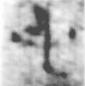屯
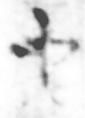屯
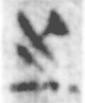之
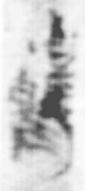○（翠）
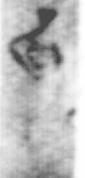首
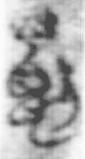○（貂）
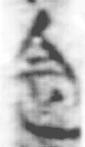定
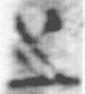之
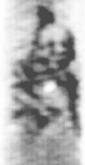頸
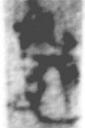○（豻）
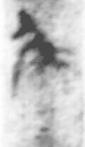尾
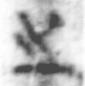之
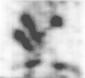之
